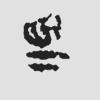則
